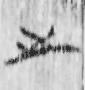之
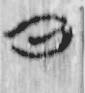日
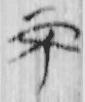不
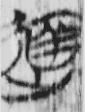𬨭（將）
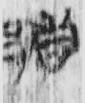郬
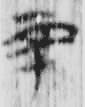辛
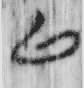㠯（以）
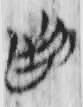○（廷）
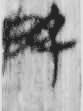阩
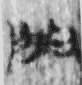門
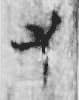又
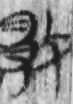敗
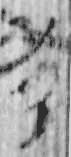秀
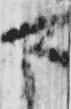不
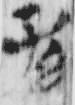孫
